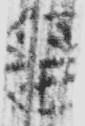○（貌）
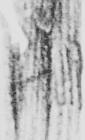所
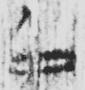㠯（以）
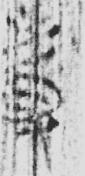○（文）
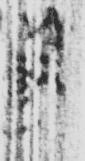節
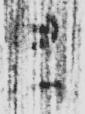也
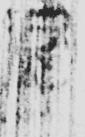君子
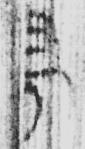𡵂（美）
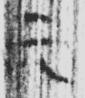亓（其）
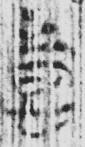情
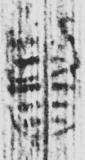貴
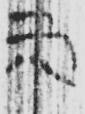亓（其）
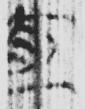宜（義）
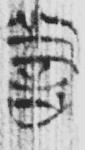善
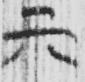亓（其）
